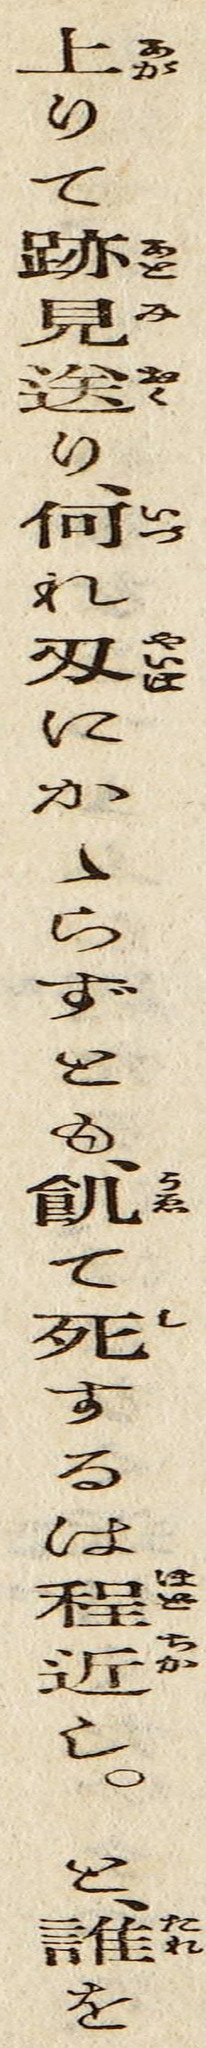上りて跡見送り、何れ刃にかゝらずとも、飢て死するは程近し。と、誰を
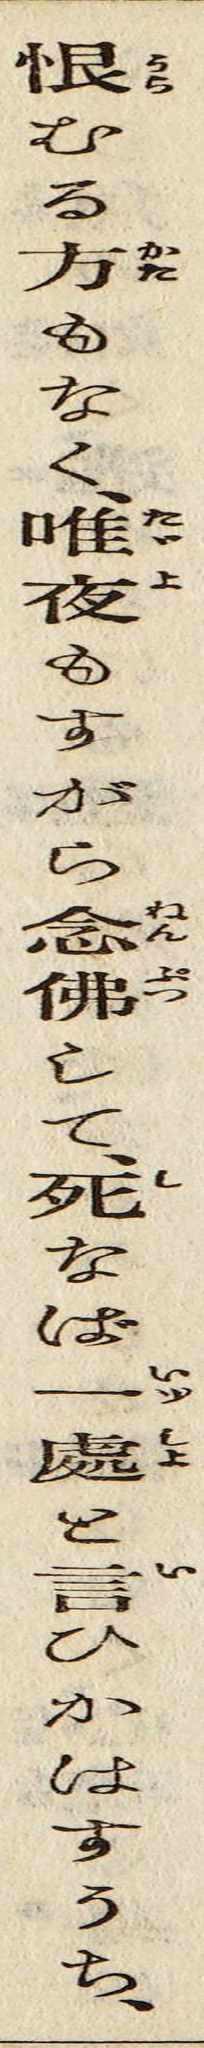恨むる方もなく、唯夜もすがら念仏して、死なば一処と言ひかはすうち、
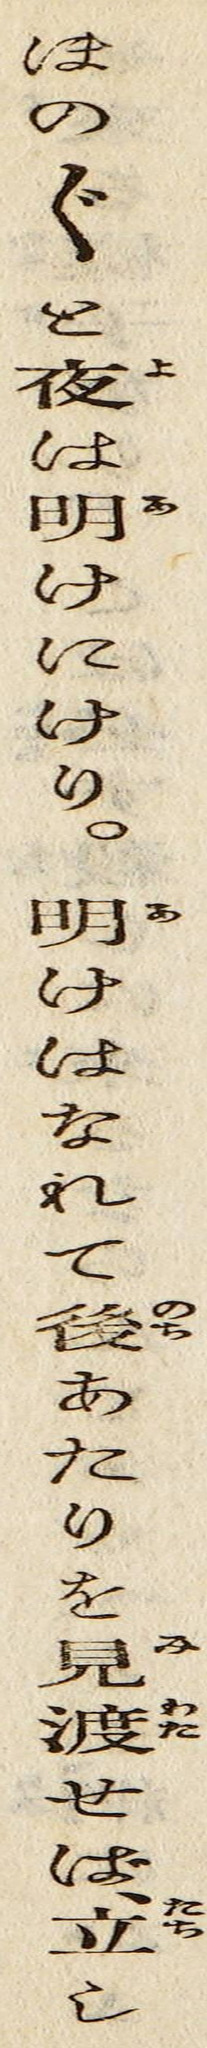ほの〴〵と夜は明けにけり。明けはなれて後あたりを見渡せば、立し
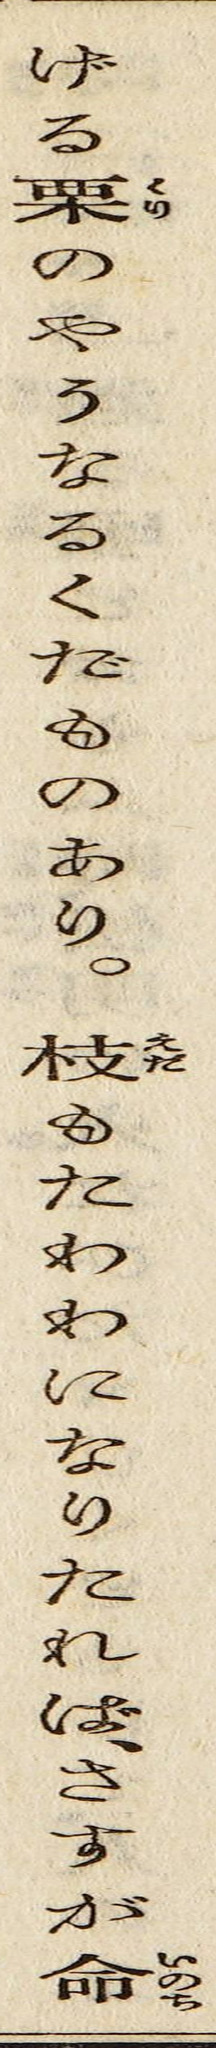げる栗のやうなるくだものあり。枝もたわわになりたれば、さすが命
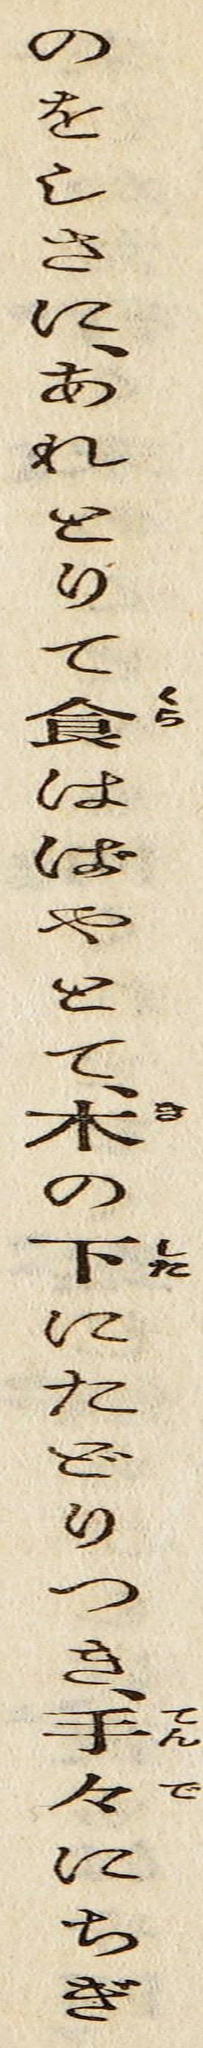のをしさに、あれとりて食はばやとて、木の下にたどりつき、手々にちぎ
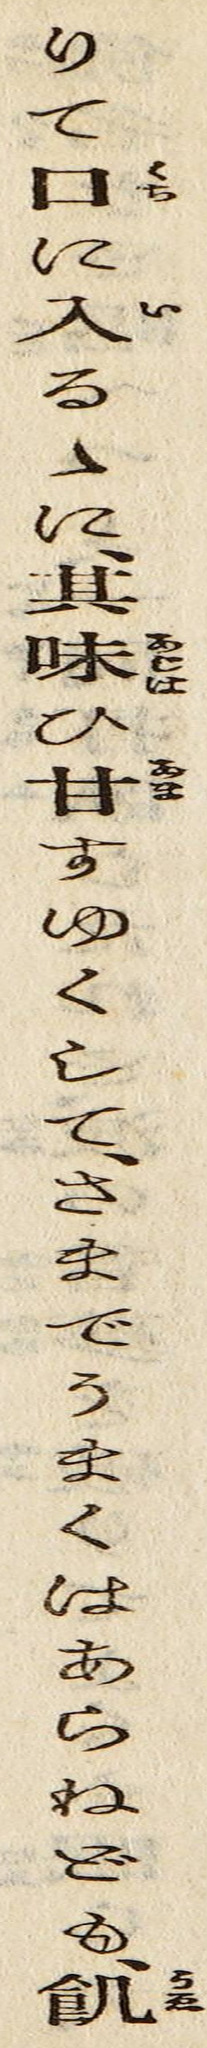りて口に入るゝに、其味ひ甘すゆくして、さまでうまくはあらねども、飢
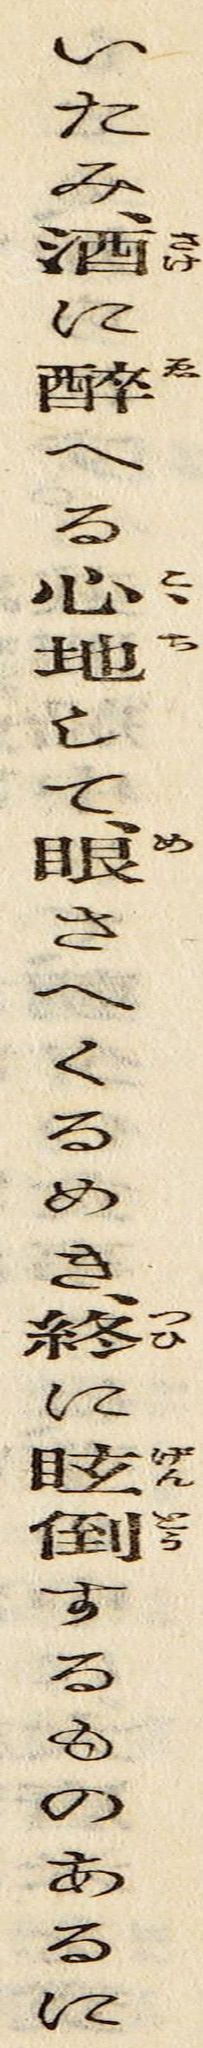いたみ、酒に酔へる心地して、眼さへくるめき、終に眩倒するものあるに
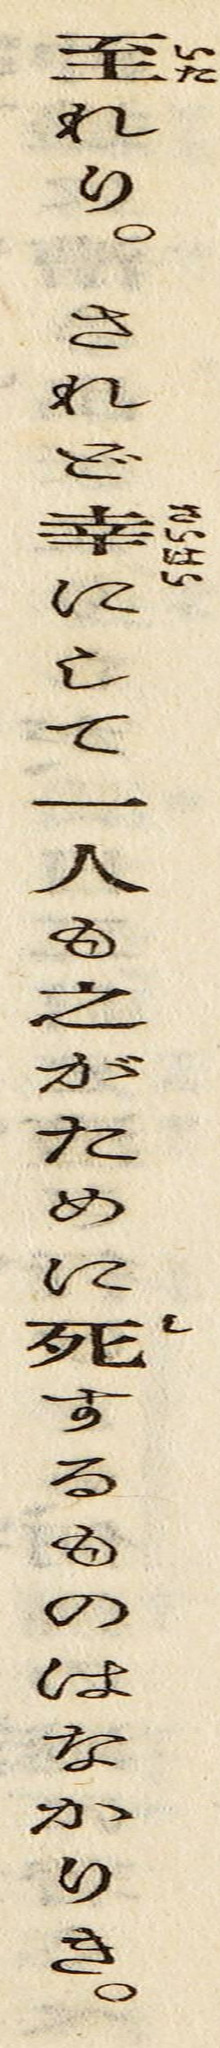至れり。されど幸にして一人も之がために死するものはなかりき。
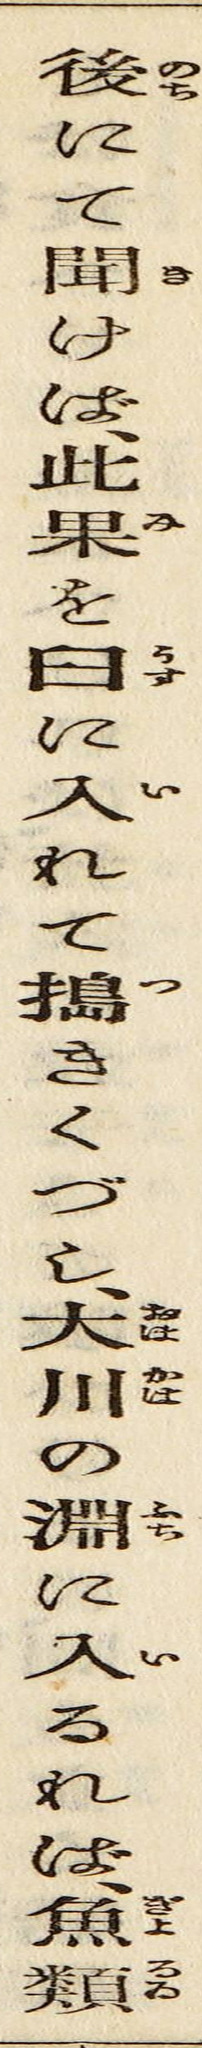後にて聞けば、此果を臼に入れて搗きくづし、大川の淵に入るれば、魚類
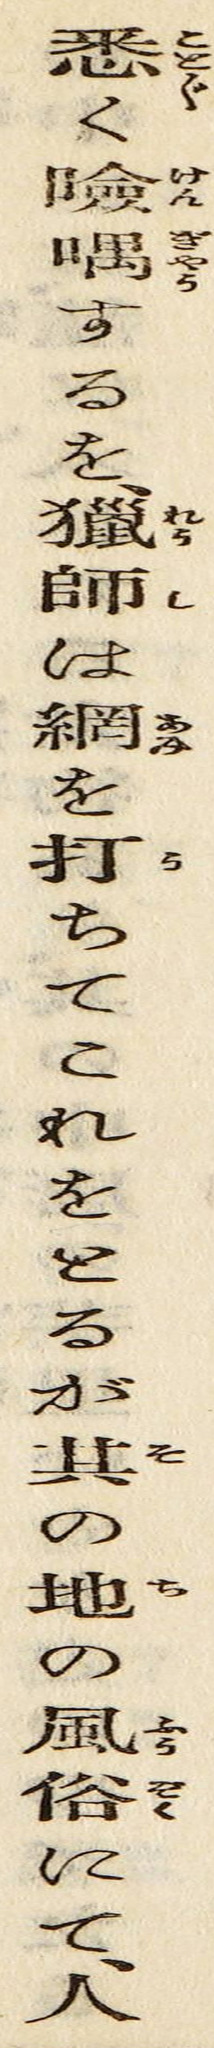悉く噞喁するを、猟師は網を打ちてこれをとるが其の地の風俗にて、人
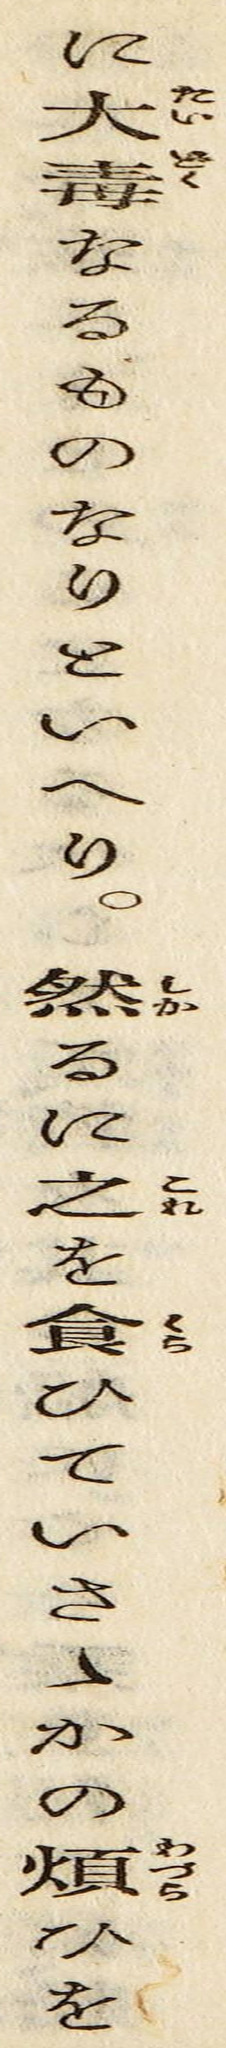に大毒なるものなりといへり。然るに之を食ひていさゝかの煩ひを
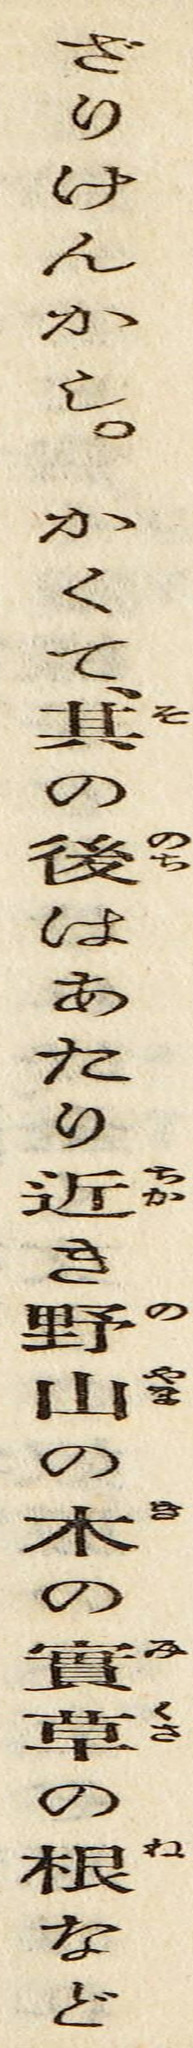ざりけんかし。かくて、其の後はあたり近き野山の木の実草の根など
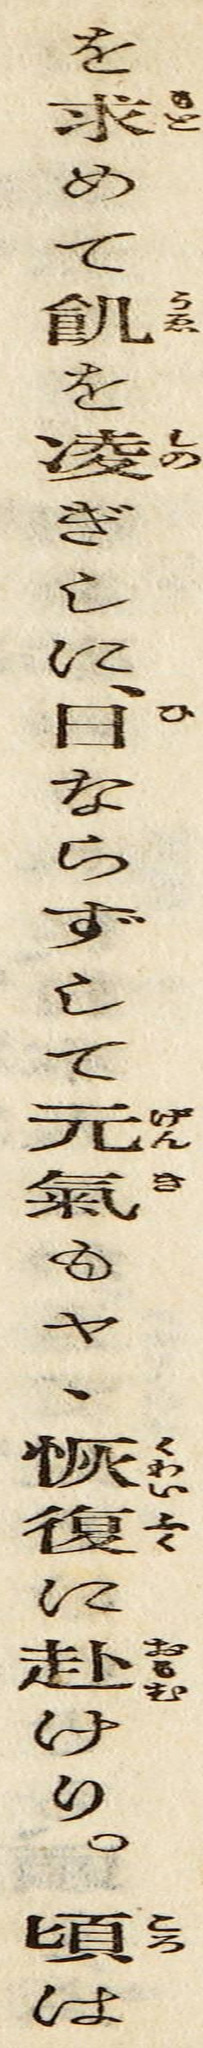を求めて飢を凌ぎしに、日ならずして元気もヤヽ恢復に赴けり。頃は
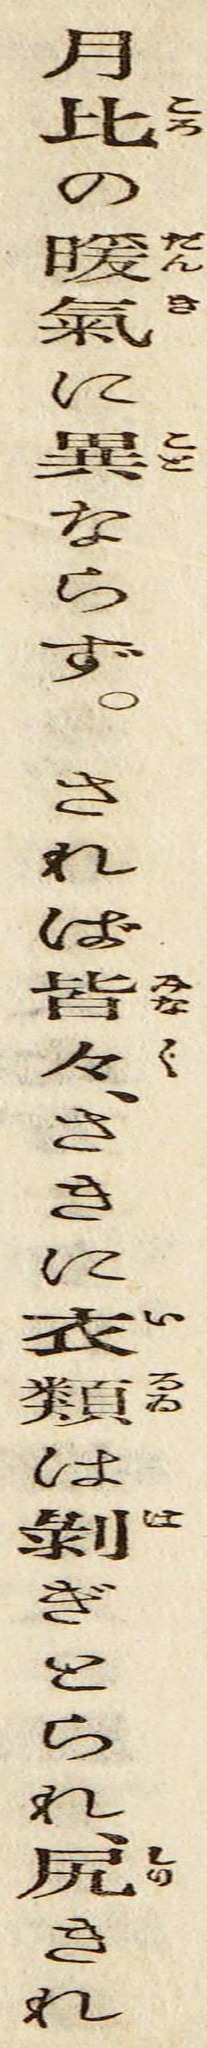月比の暖気に異ならず。されば皆々、さきに衣類は剝ぎとられ、尻きれ
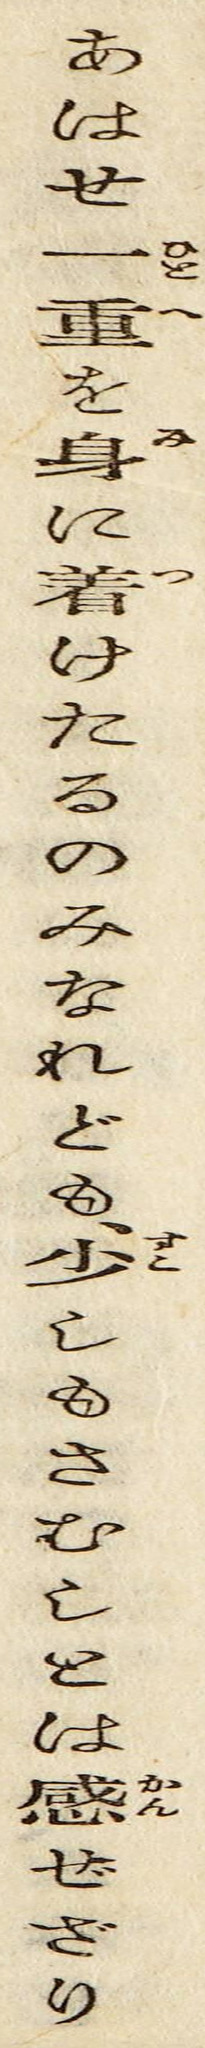あはせ一重を身に着けたるのみなれども、少しもさむしとは感ぜざり

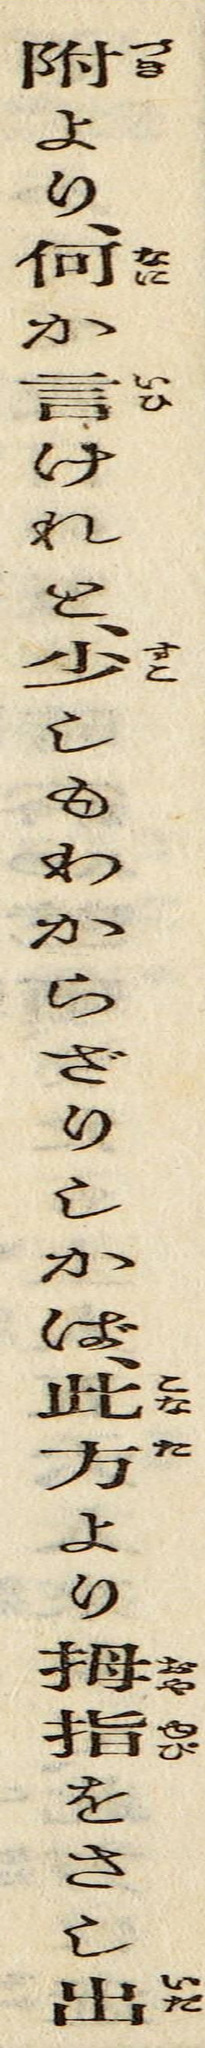附より、何か言けれと、少しもわからざりしかば、此方より拇指をさし出
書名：日本漂流譚
